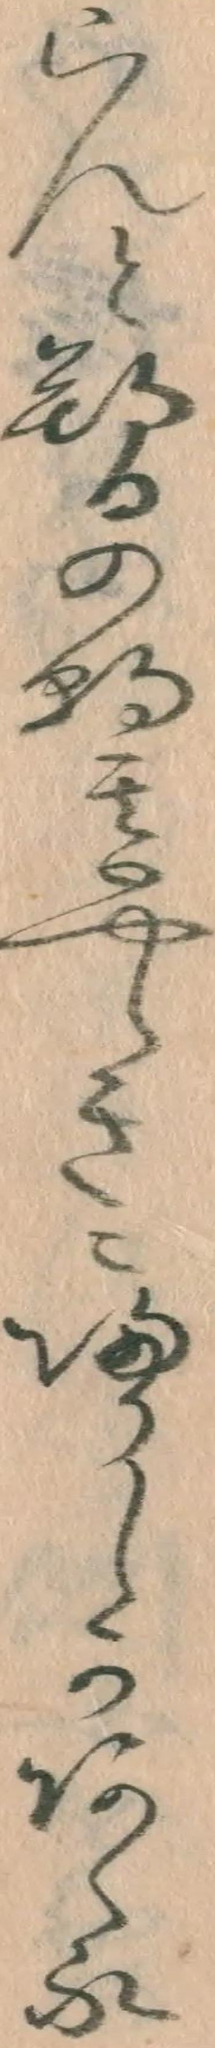らんと朔日の朝其御やしきニ帰りしかあくる
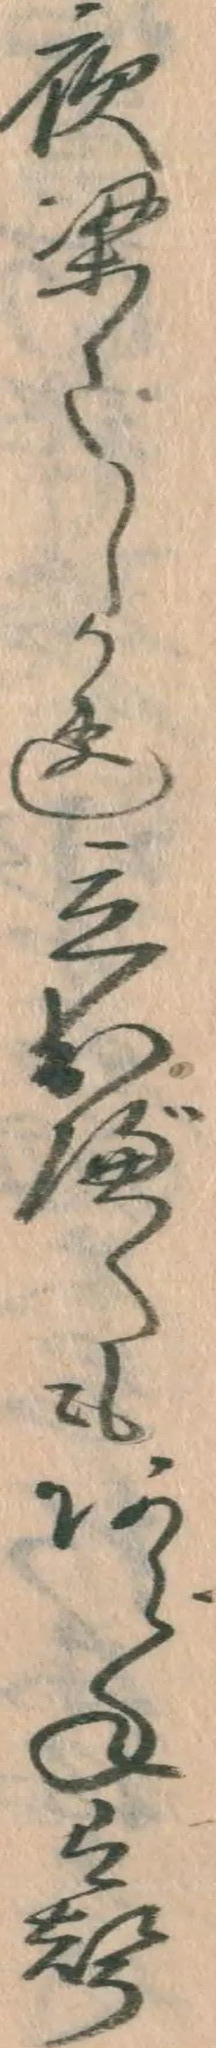夜梁にしかれ立出べくもあらねは聲
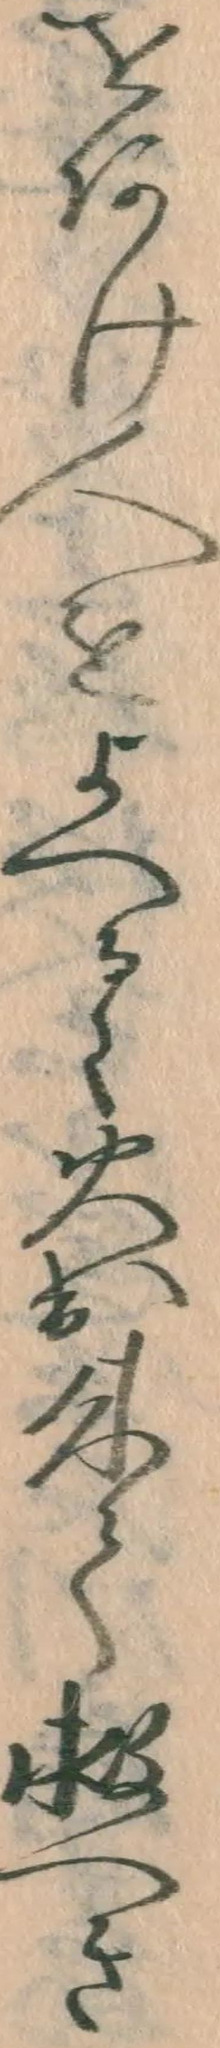をかけ人をよへるに火出来て救へき
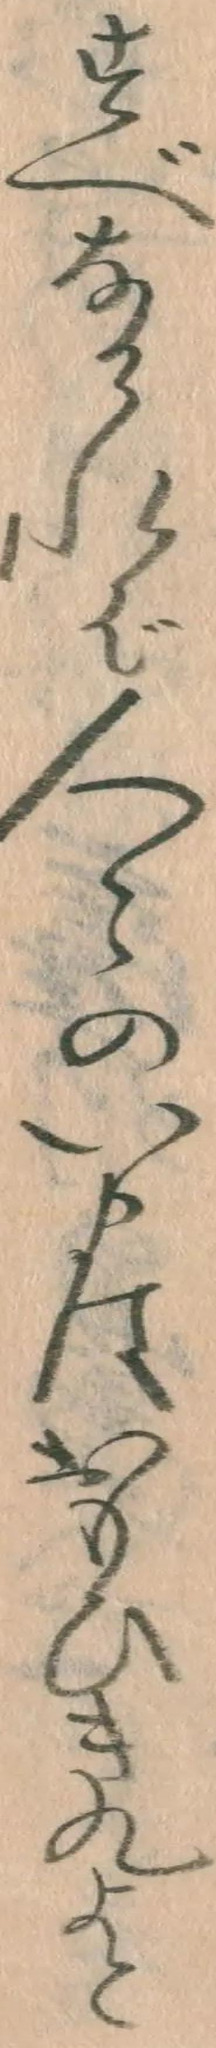すべなければ人々のいまはおもひきれよと
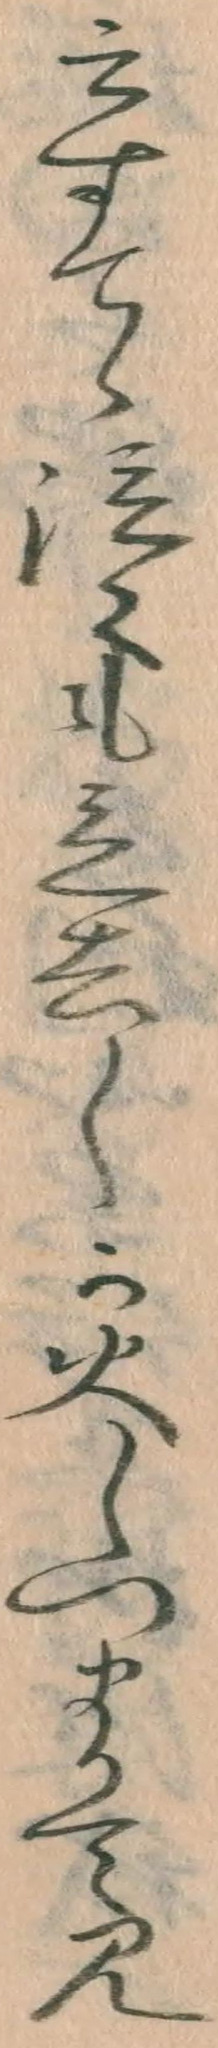云すてゝ泣々も立去しか火しつまりて見
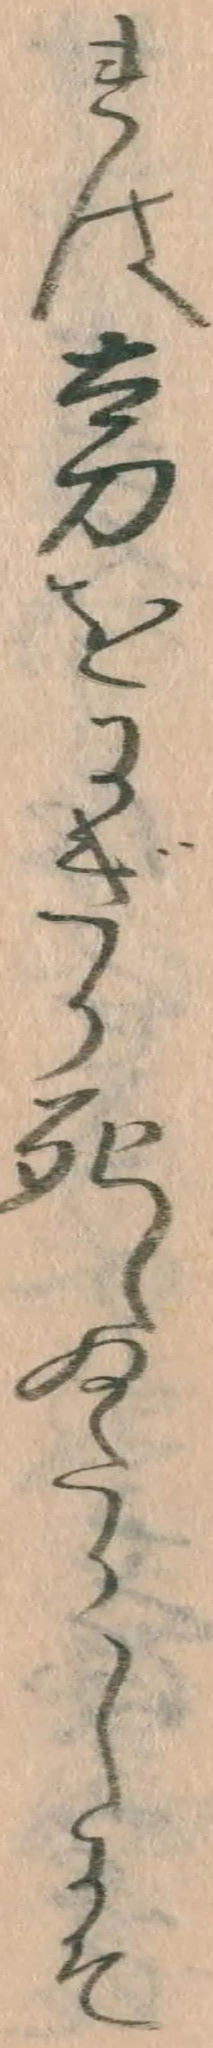れは太刀をにぎり死しゐたりしにそ
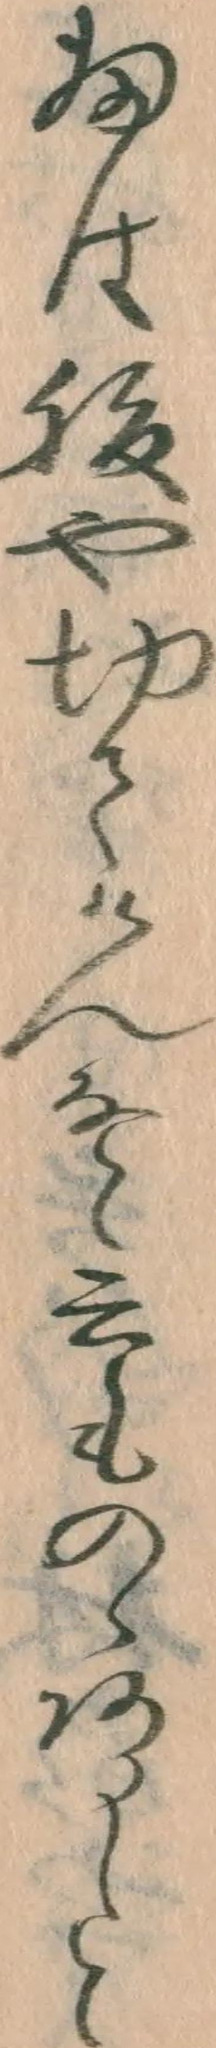扠は腹や切てけんなと云ものゝありしと
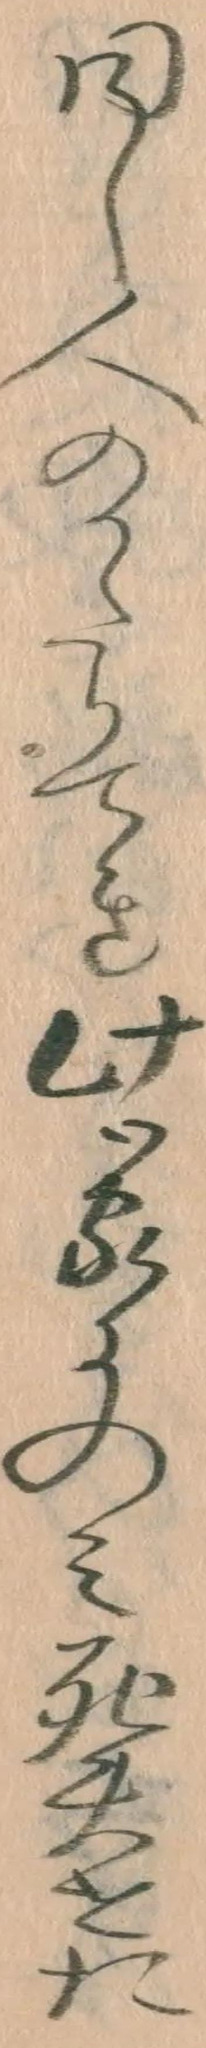同し人のかたりても此御家にのミ死失せた
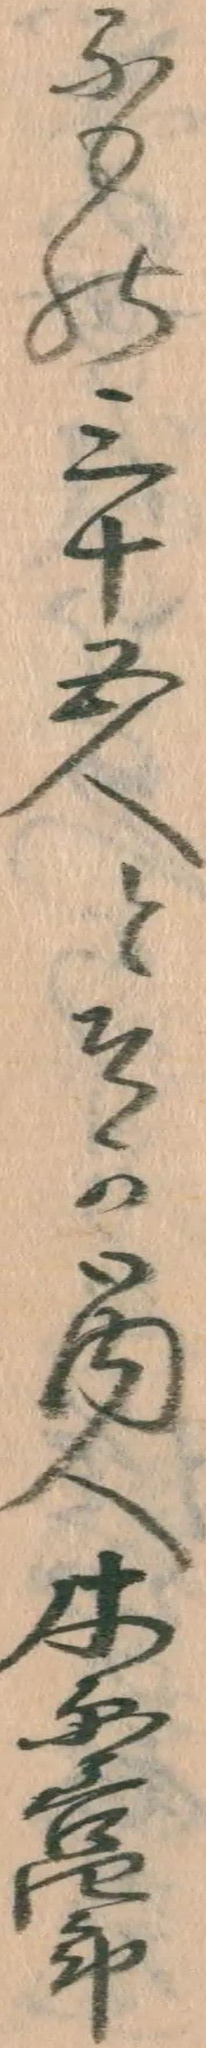るもの三十五人とそか御内人木原善四郎
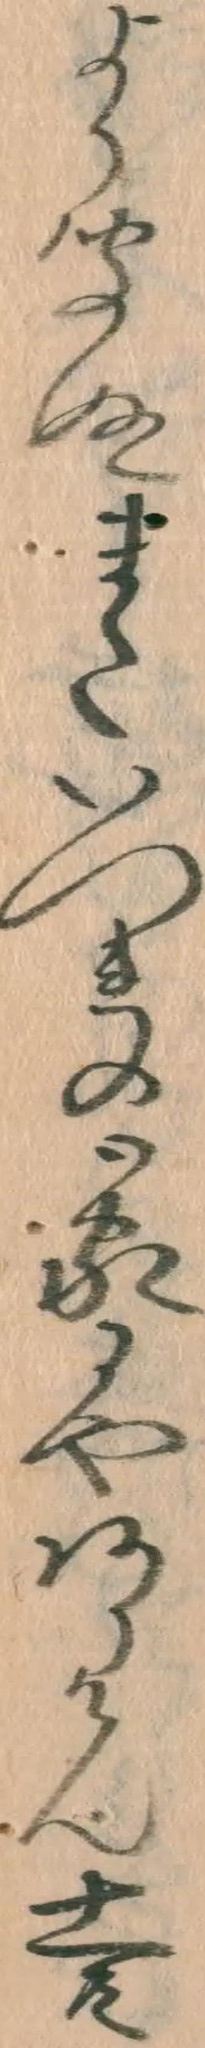より聞ぬまたいつれの御家にやありけん士共
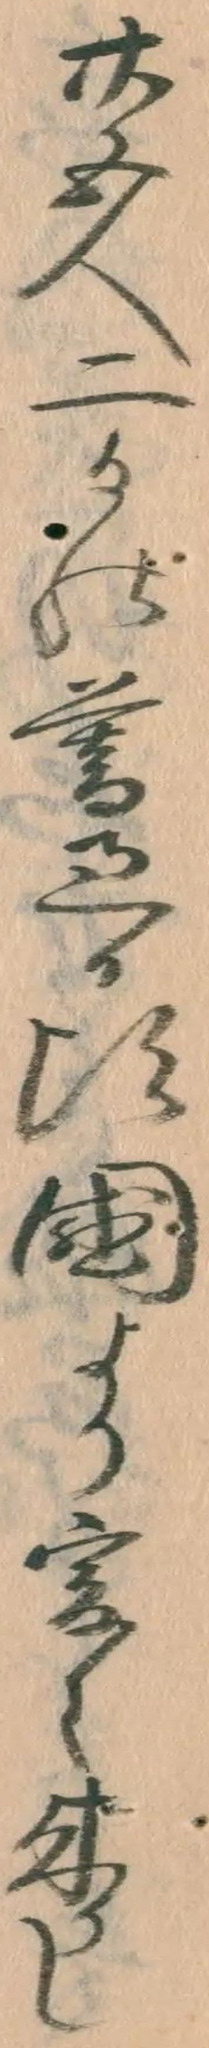廿五人二日の暮過る頃国より爰に来りし
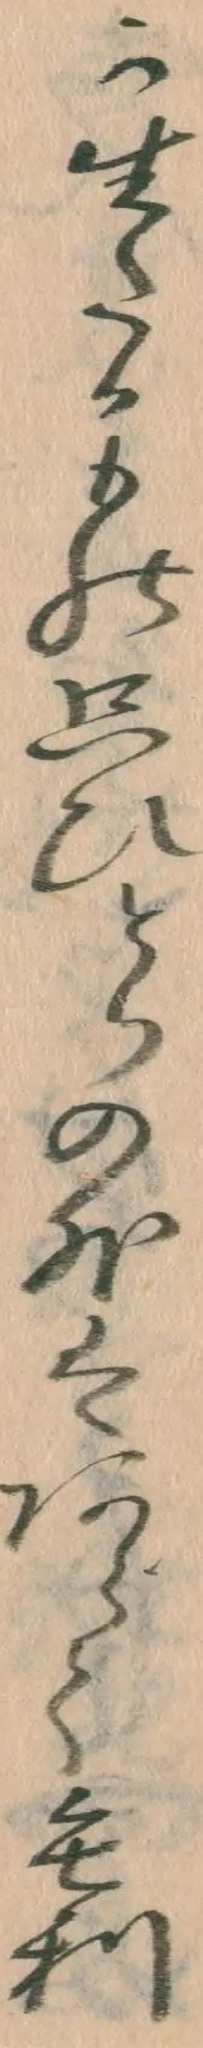か生たるもの只ひとりの外はあらて毛利
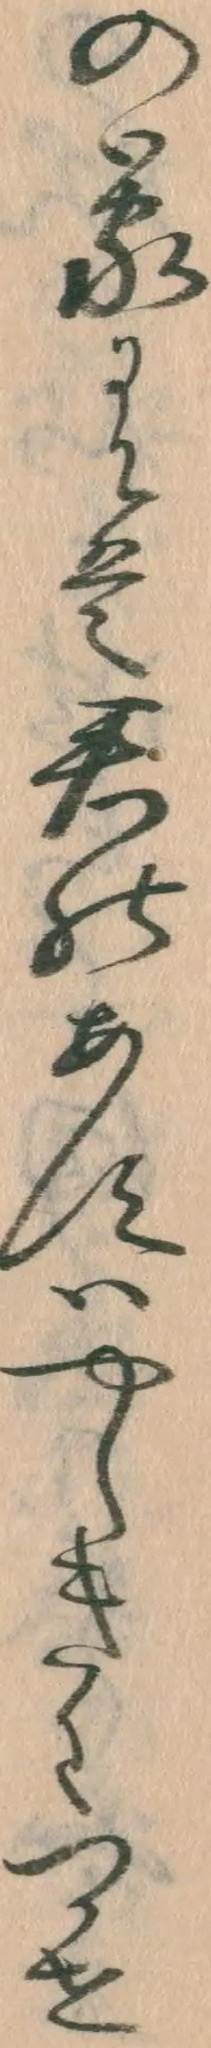の御家にては君のあすハやしきにつかせ
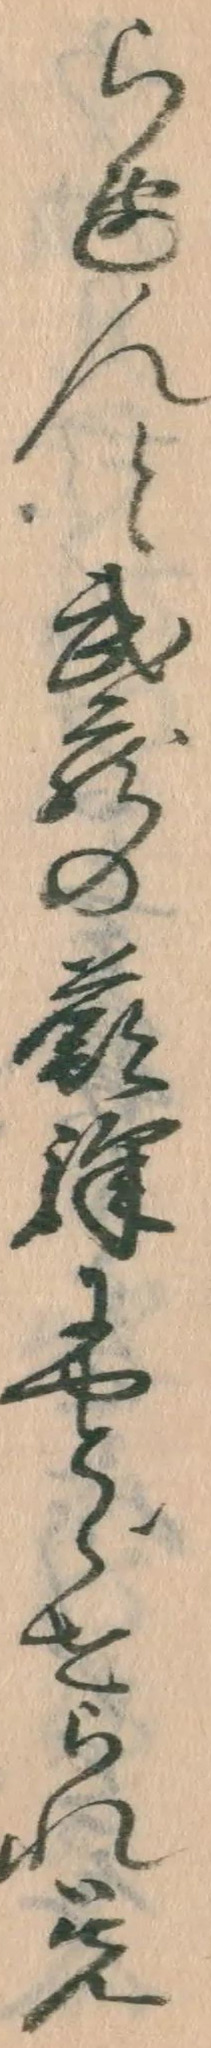られんと武蔵の藤澤にやとらせられ御先
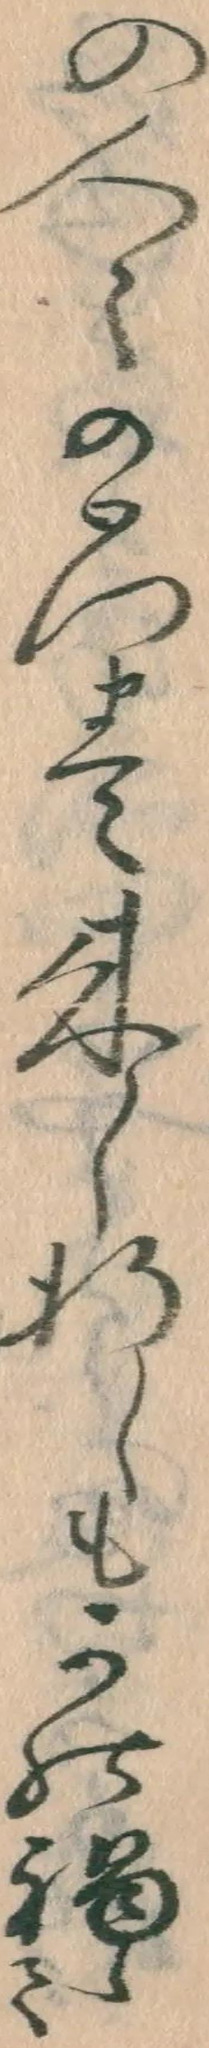の人々の御門まて来し折しもかの禍して
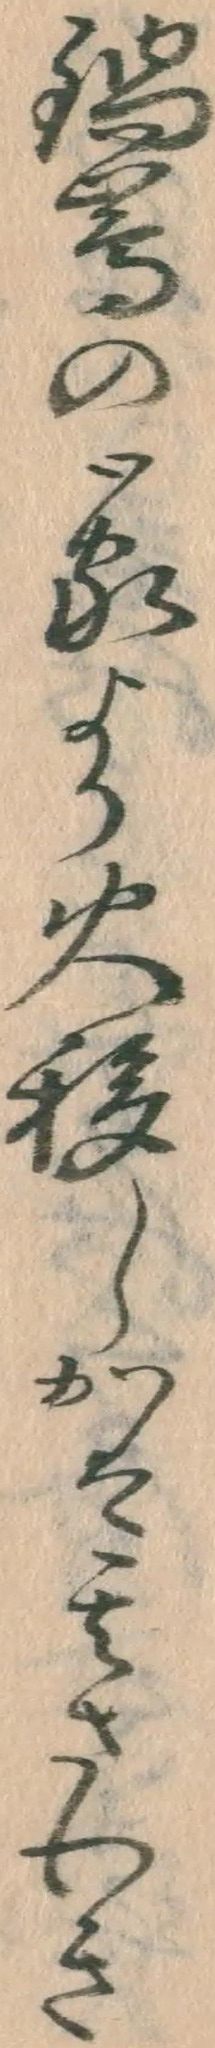鍋嶋の御家より火移しかは其さわき
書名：麗斎叢書. 20
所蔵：国立国会図書館 National Diet Library, JAPAN
